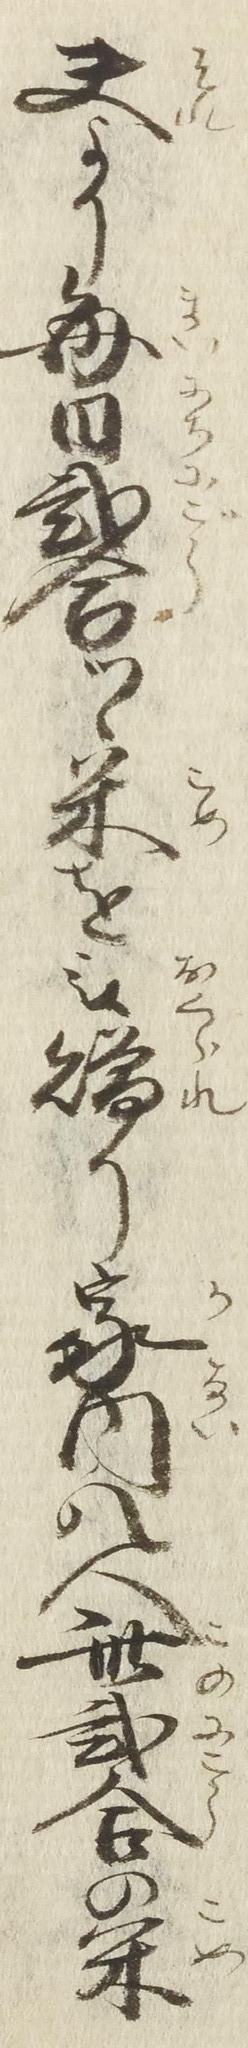夫より毎日弐合ツヽ米を被贈り家内八人此弐合の米
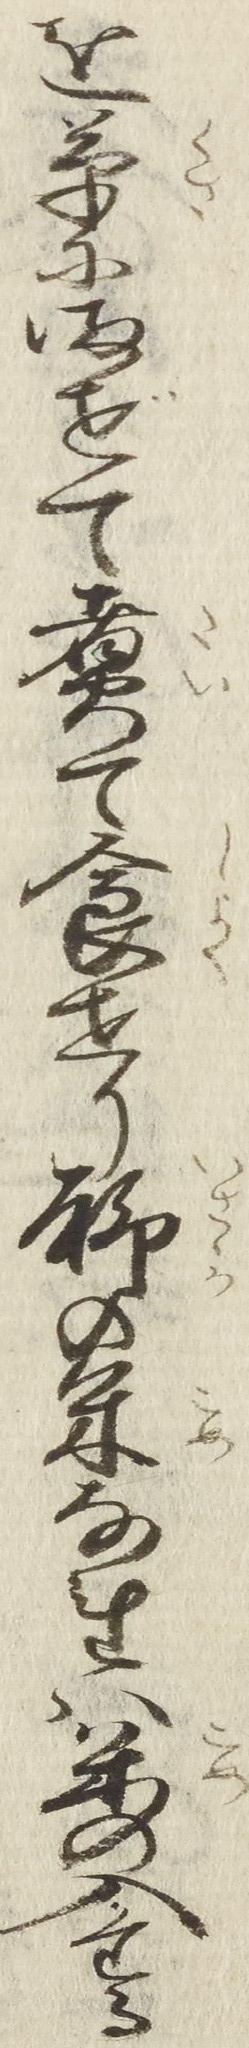を草にまぜて煮て食せり聊の米なれは米の入たる
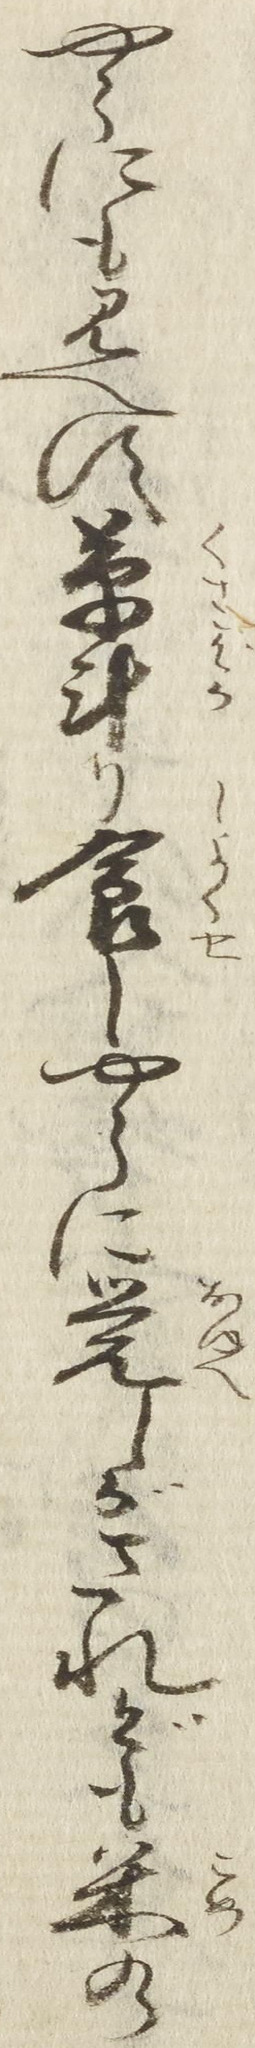やうにも見へす草斗り食しやうに覚しがされども米の
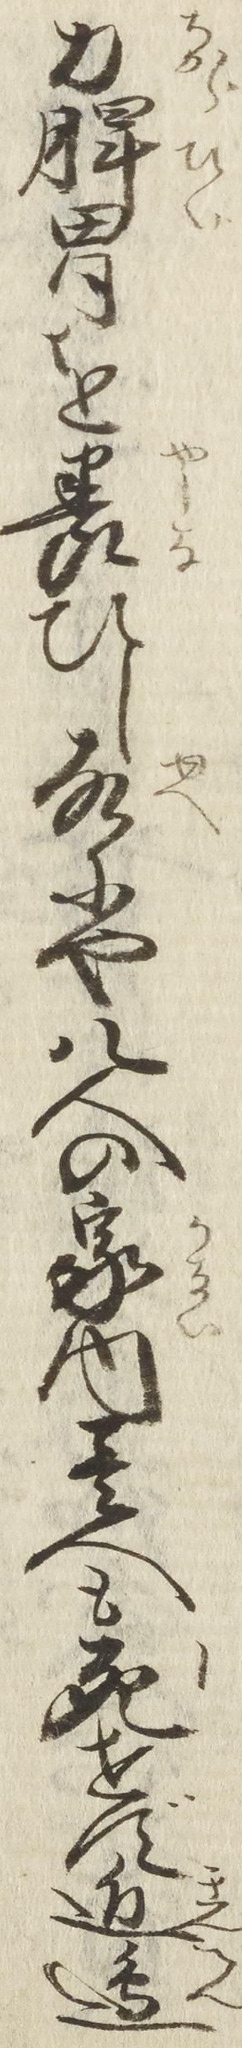力脾胃を養ひし故にや八人の家内壱人も死せず近辺
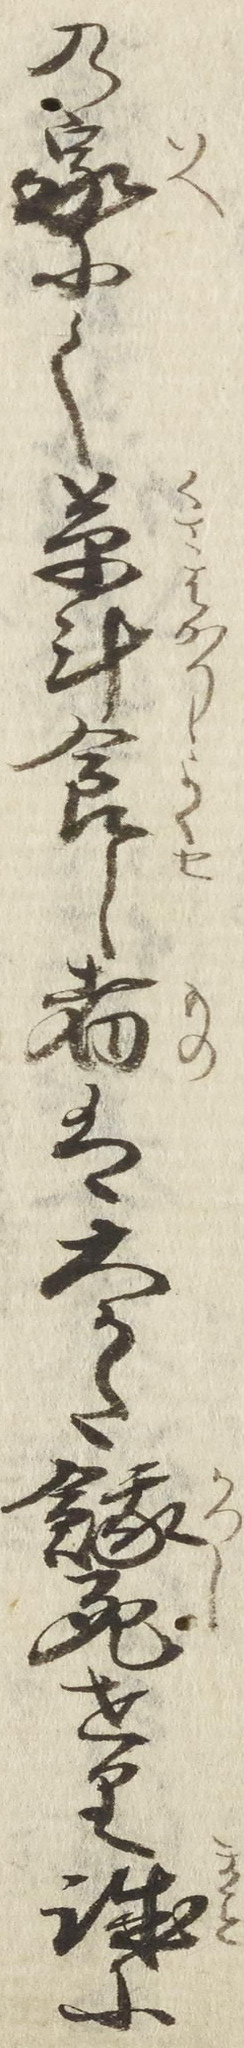の家にて草斗食し者は大かた餓死せり誠に
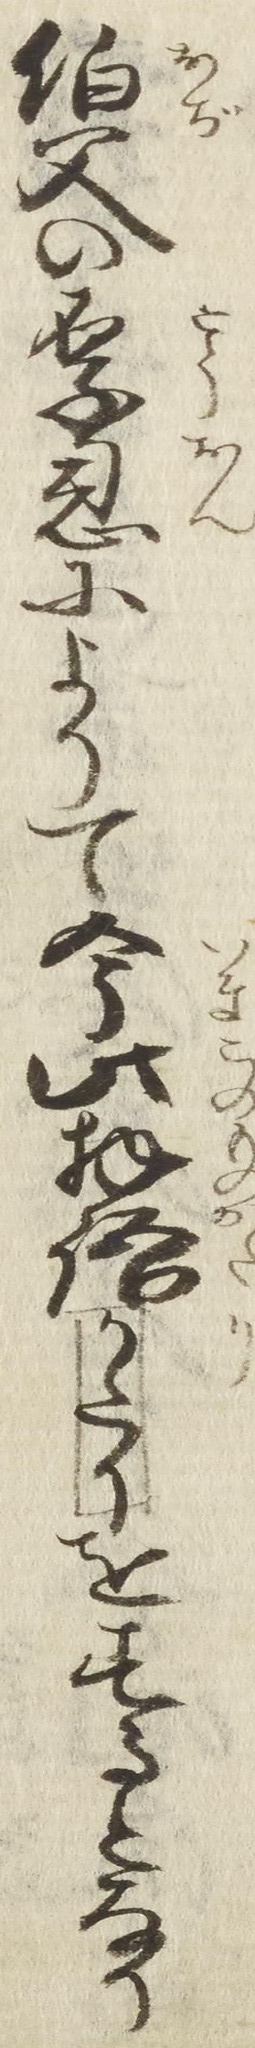伯父の厚恩によりて今此物語かたりをするとなり

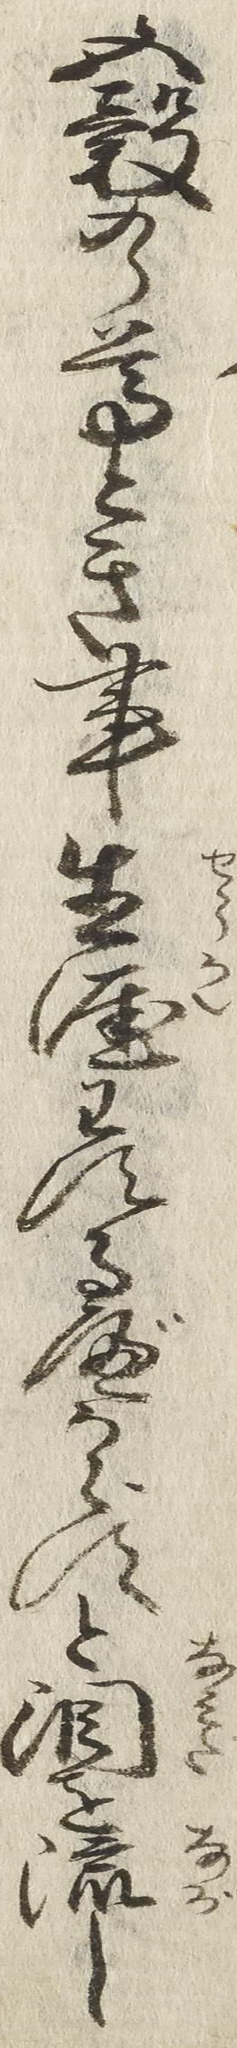五穀の尊とき事生涯わするべからすと泪を流し
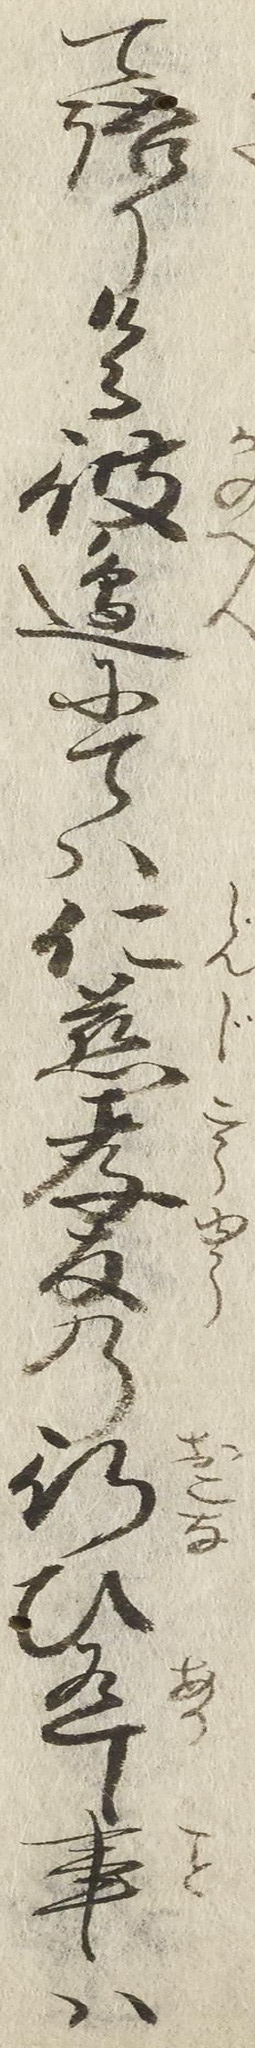て語りける彼辺にては仁慈孝友の行ひ有し事は
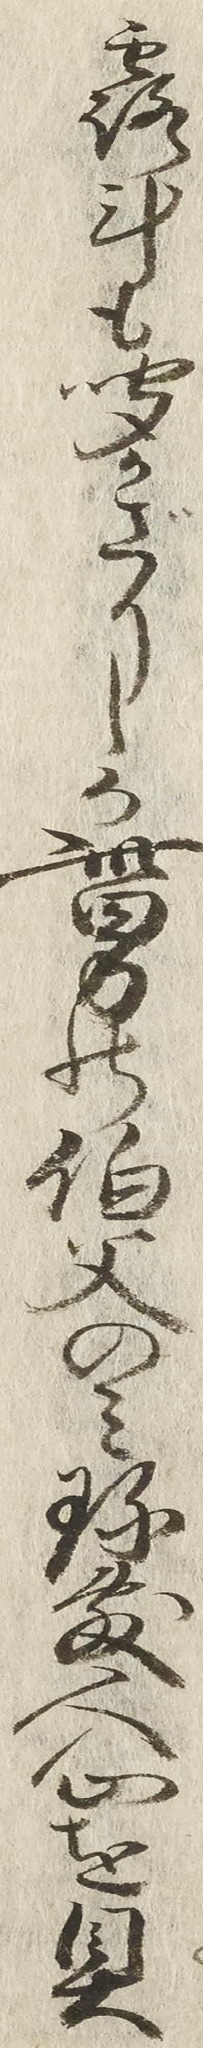露斗も聞かざりしか此男の伯父のみ珍敷人心を具
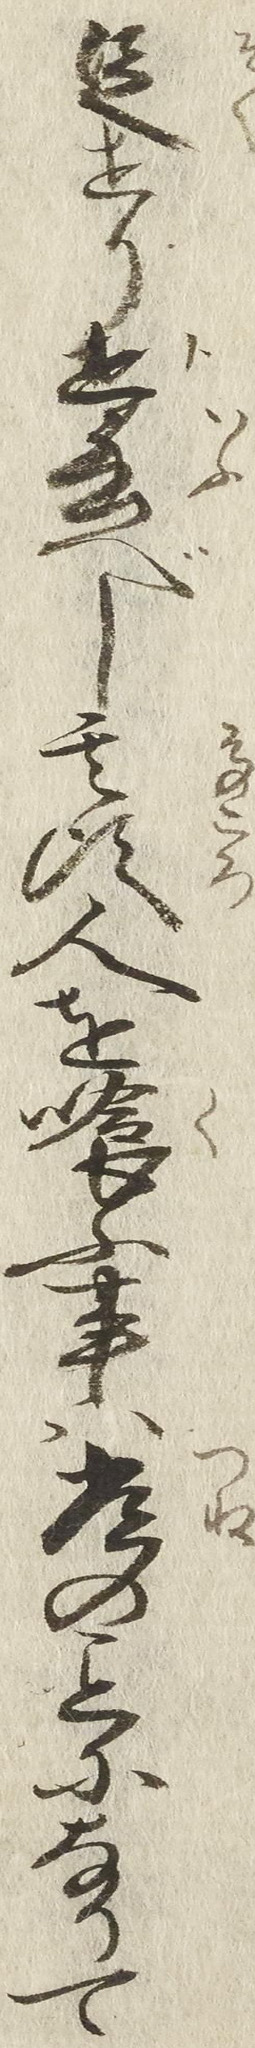足せりとト言べし其頃人を喰ふ事は常のことになりて
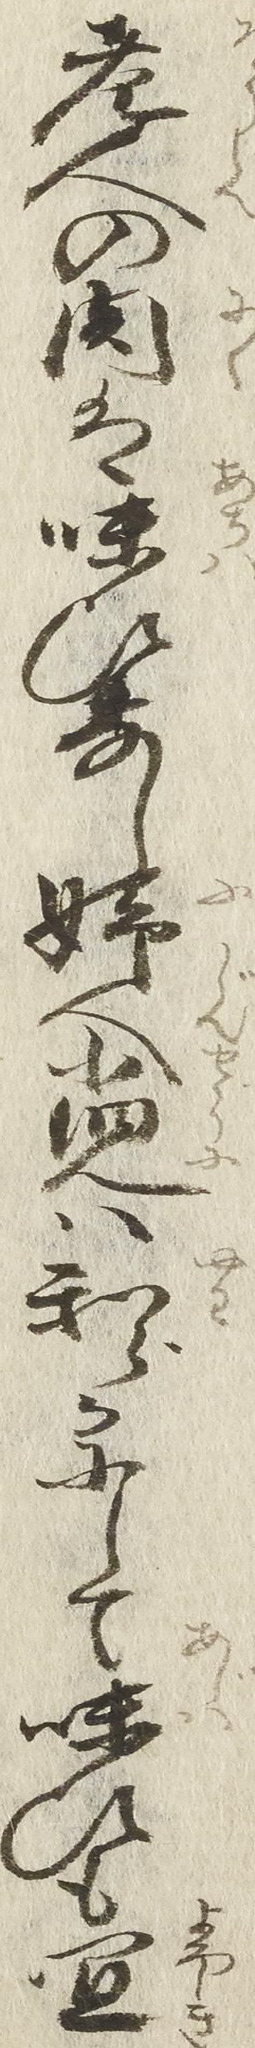老人の肉は味ひなし婦人小児は和らかにして味ひも宜
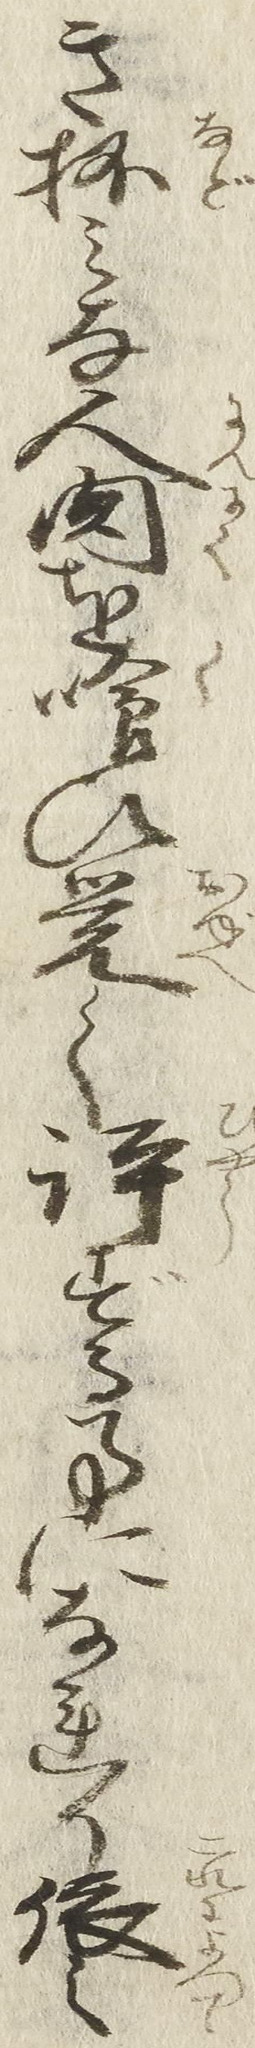き抔みな人肉を喰ひ覚て評ずる事になれり依之
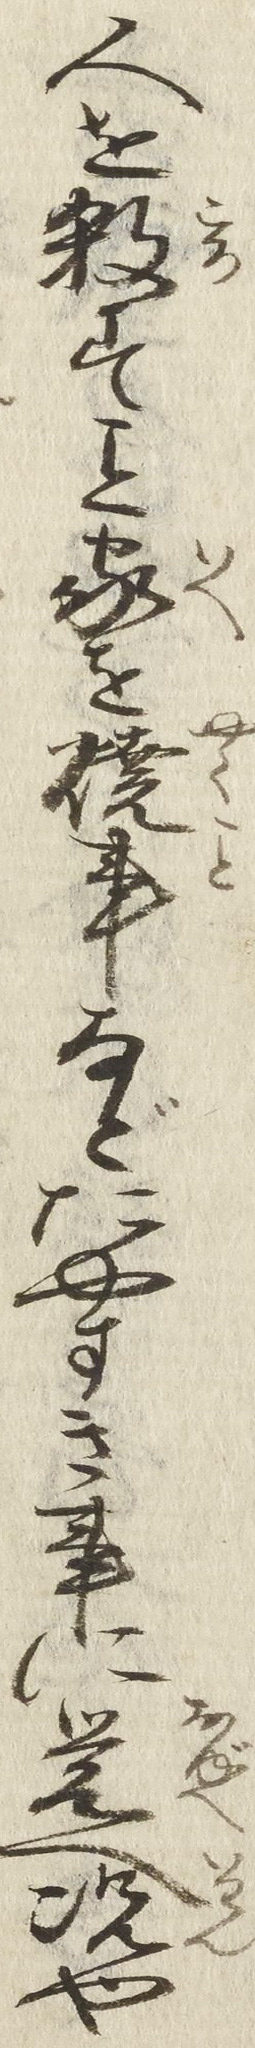人を殺すこと家を焼事などたやすき事に覚へ況や
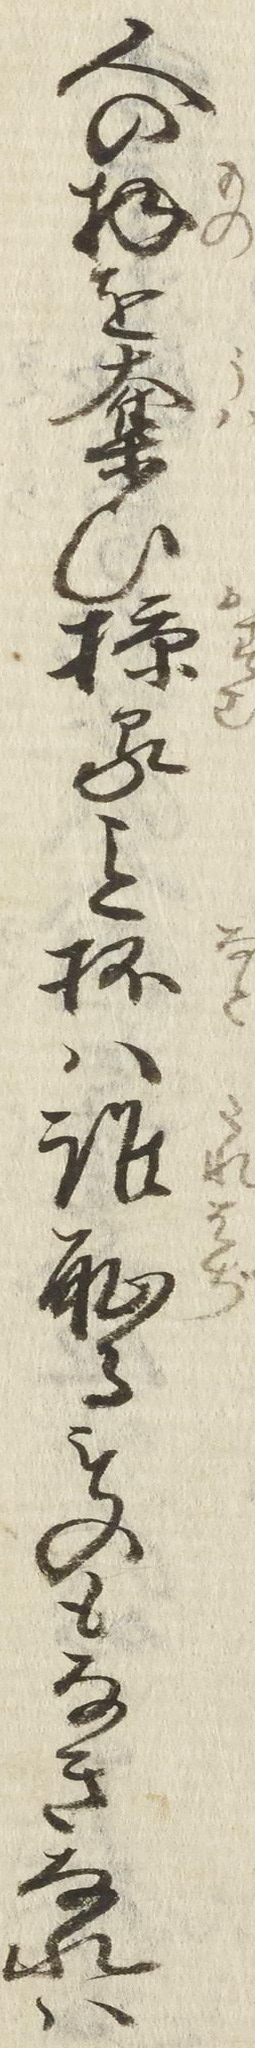人の物を奪ひ掠ること抔は誰恥るものもなきなれは
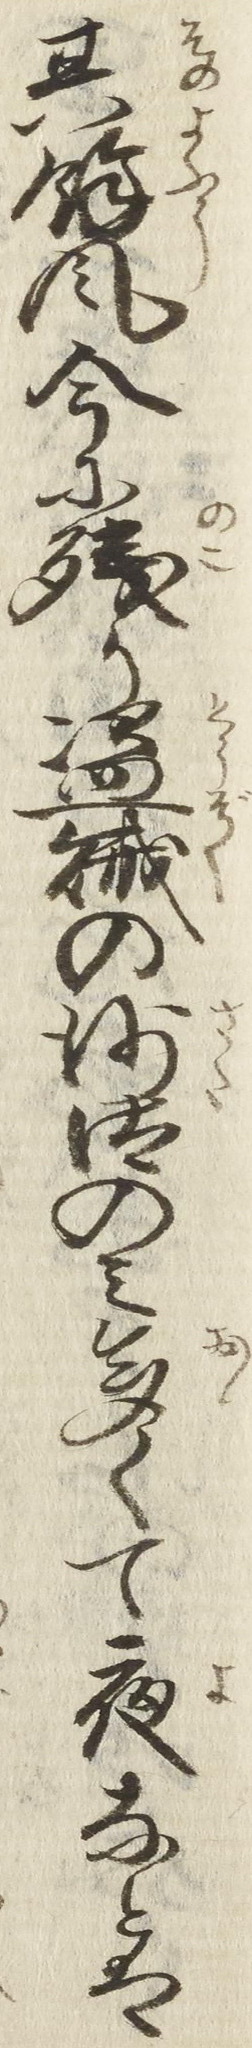其余風今に残り盗賊の沙汰のみ多くて夜なとは
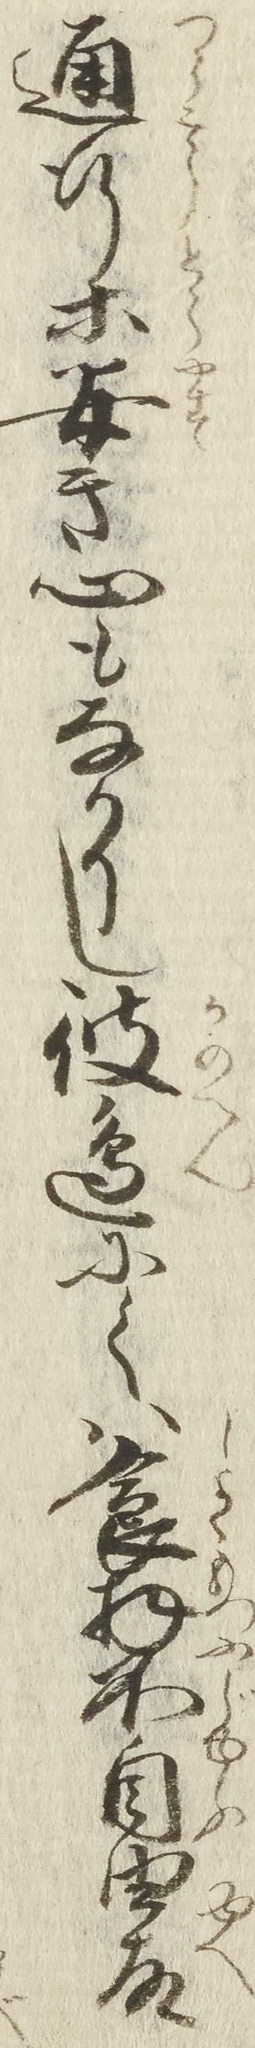通行等安き心もなかりし彼辺にては食物不自由故
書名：天明奇畧　全
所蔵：東京大学地震研究所図書室 Earthquake Research Institute Library, The University of Tokyo, JAPAN
